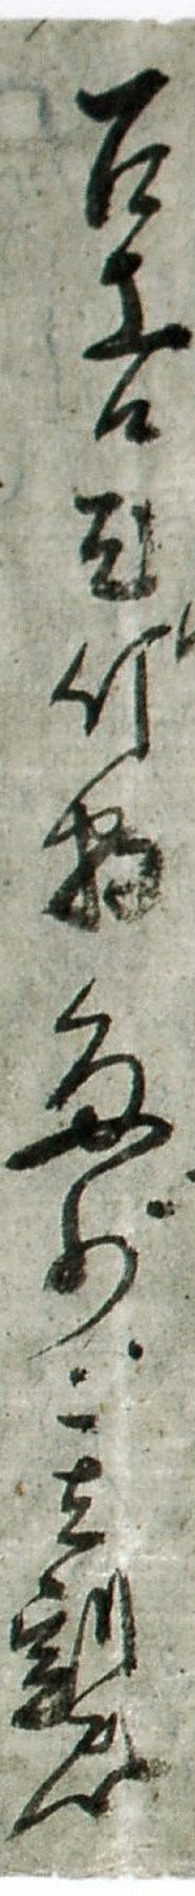召上候尤斤数多少は其割を以
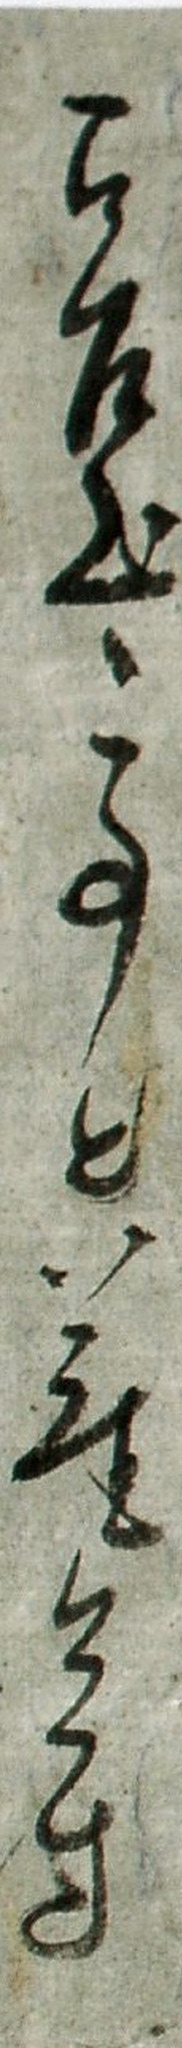被召上候事と御座候に付
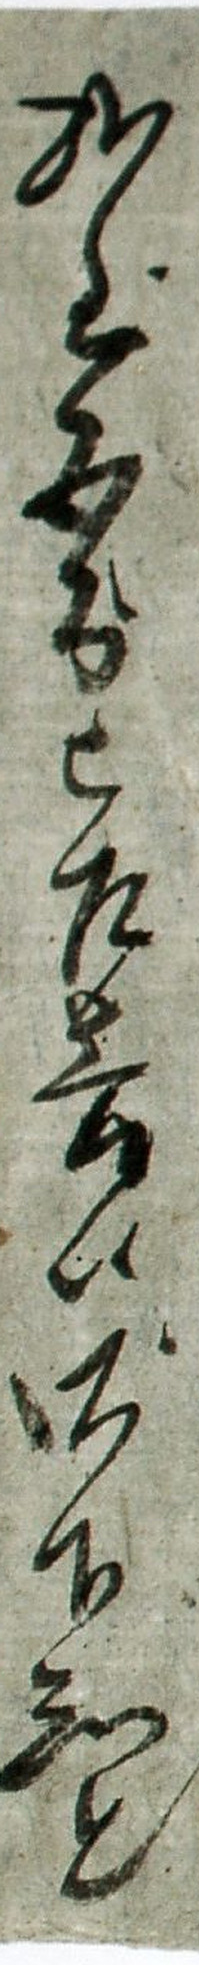弐匁五分被召上候は御下知と
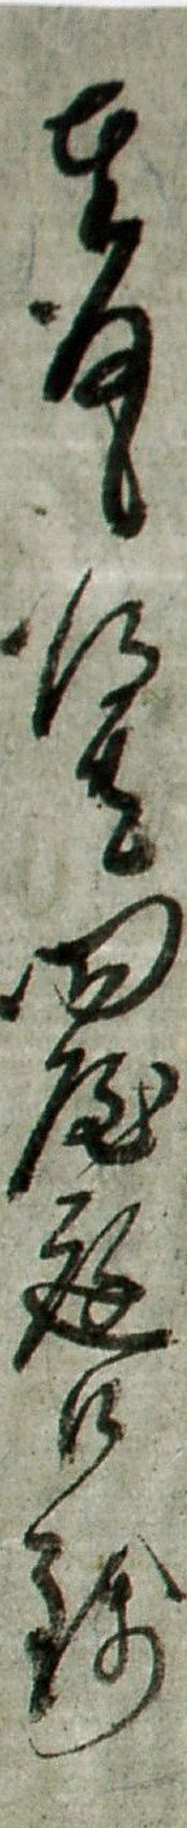奉存候得共問屋庭口銭
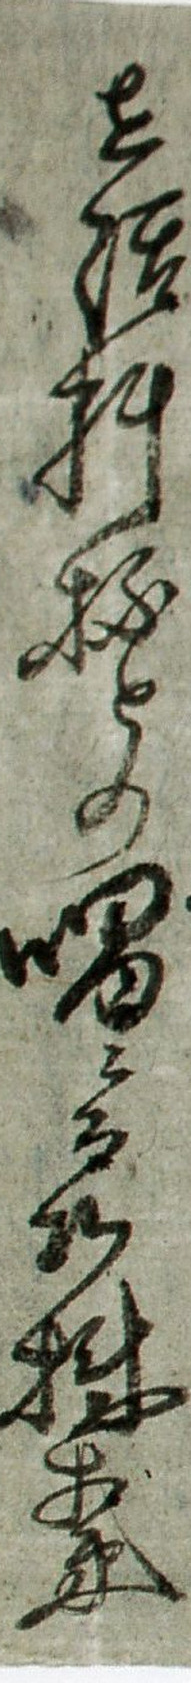世話料抔との唱にて弐株相束
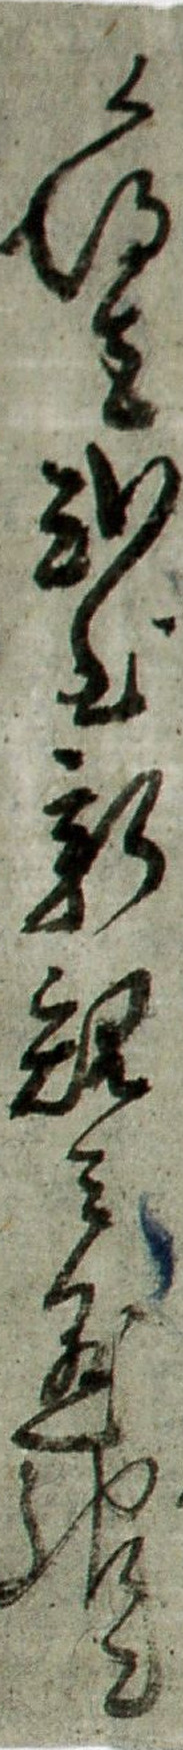候得は弐匁新規之懸銀に

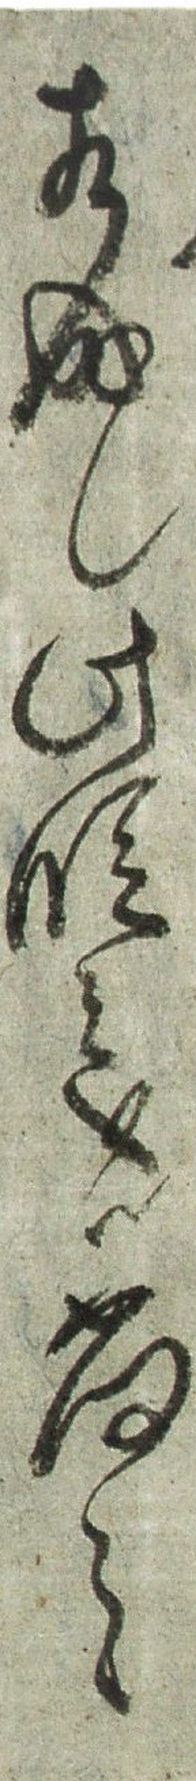相成候此段之義は如何之
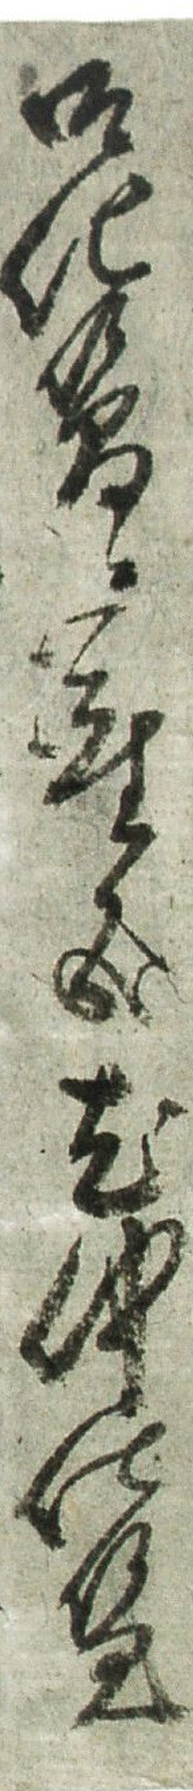御化簡に御座候哉尤仲仕賃
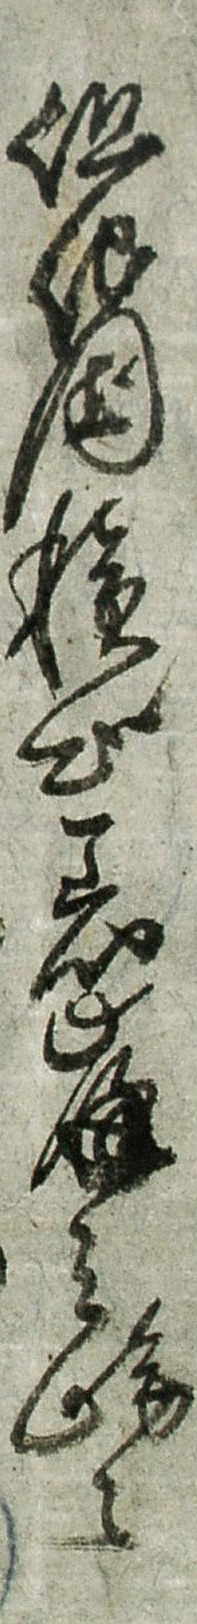但他国積出着岸之崎に
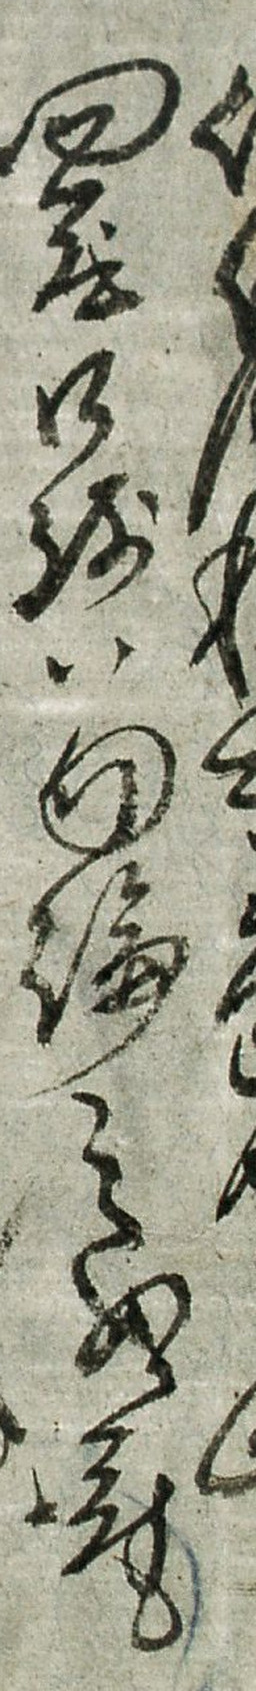問屋口銭は勿論之義に御座候
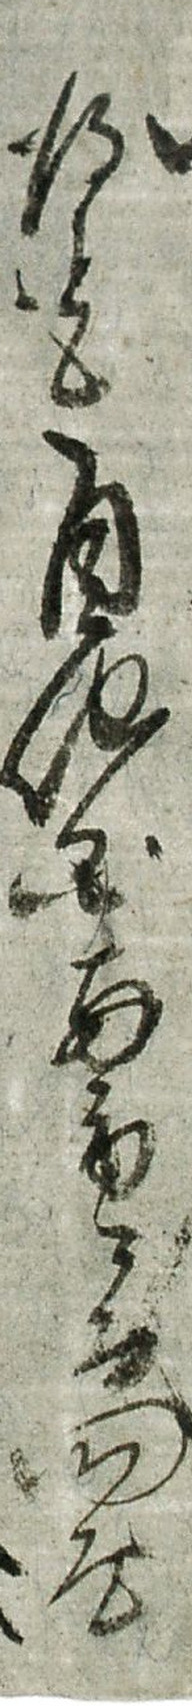得とも自他国両方にて問屋
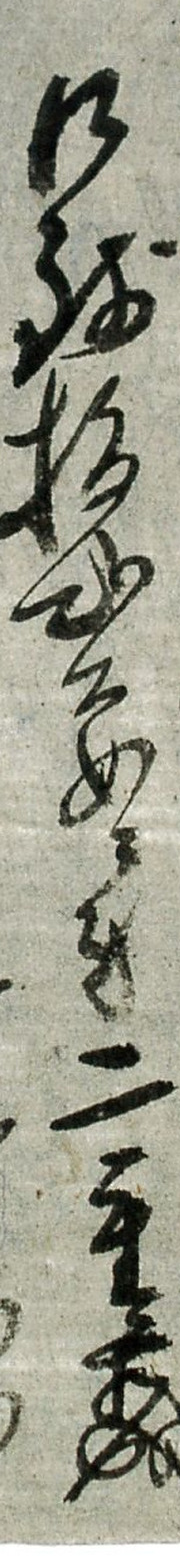口銭指出候義に付二重に相成
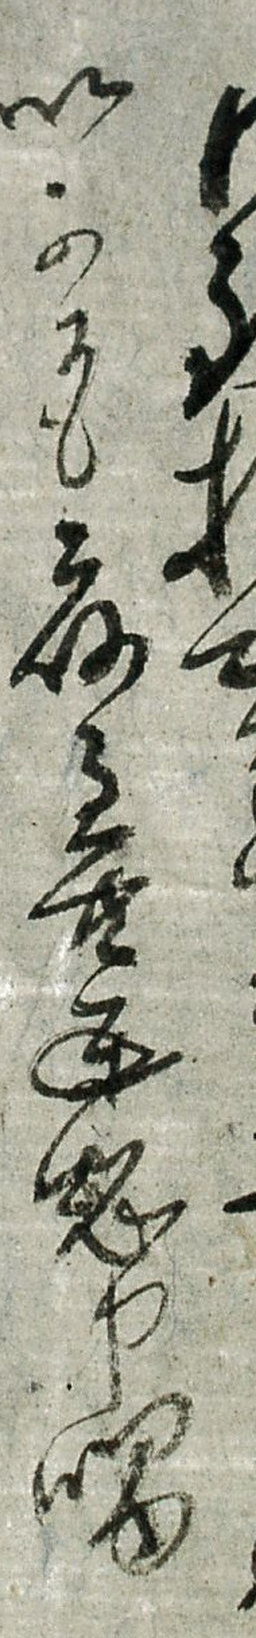いかにも荷主共迷惑申唱
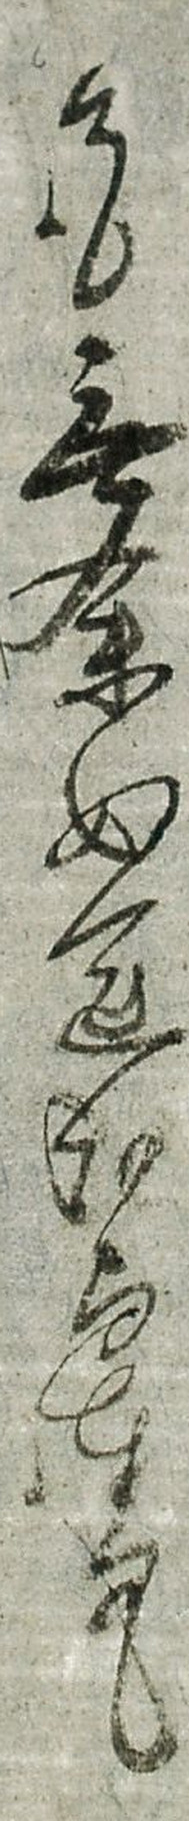候も無余義運哉と奉存候
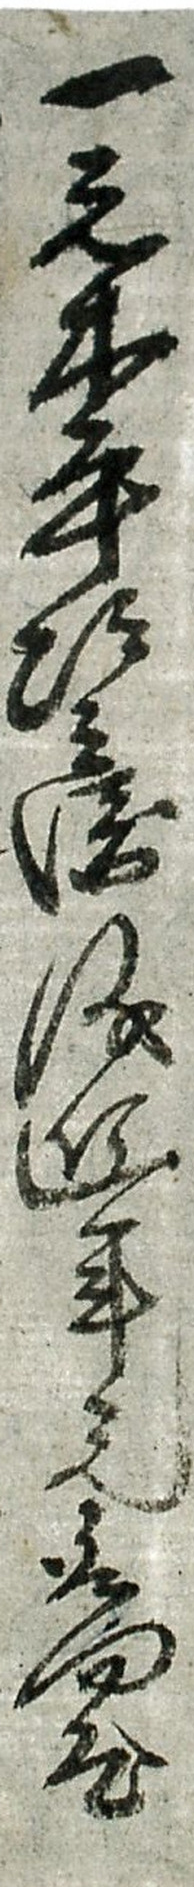一元木平次兵衛儀近年元取問屋
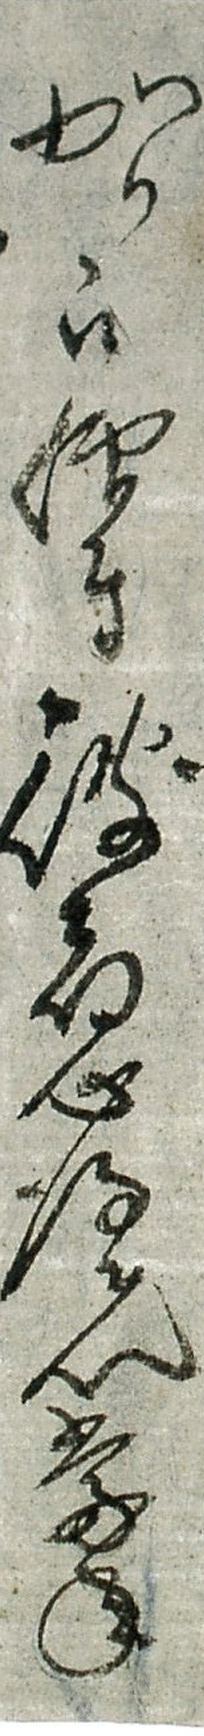加り被仰付彼者心得を以当年
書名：(美馬三好両郡百姓共煙草問屋壱手勘定ニ相成迷惑願右始末承申上書付之写）
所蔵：鳴門教育大学 Naruto University of Education
